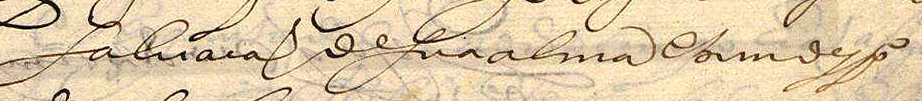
saluaçaõ de sua alma e bom despo
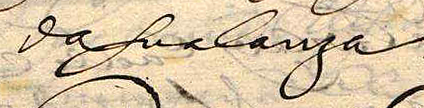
da sua cauza
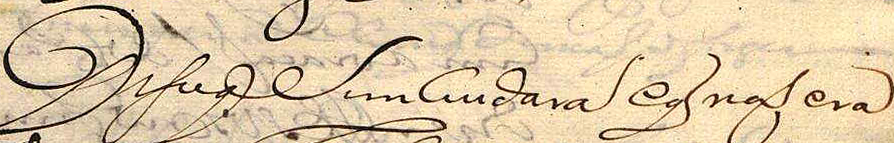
Disse q̄ Sim Cuidara e q̄ naõ era
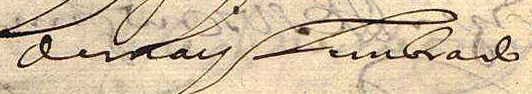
de mais Lembrado
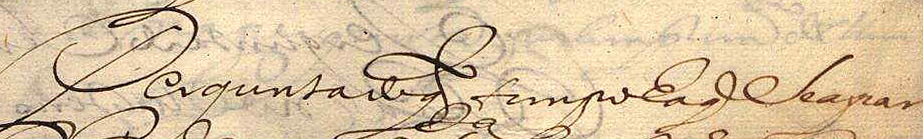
Perguntado q̄ tempo ha q̄ Se apar
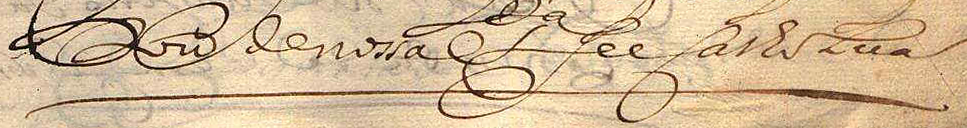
tou de nossa Sta fee CathoLica
